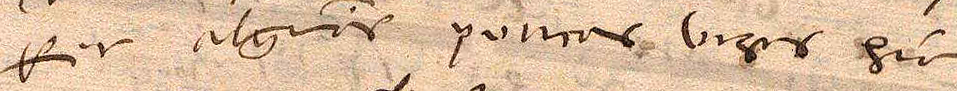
Ree alguās poucas vezes hia
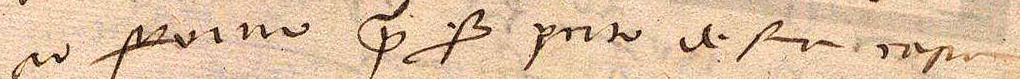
ao forno p̄o .ꞩ perto de sua casa
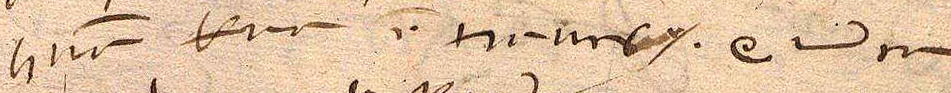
huā Rua ē traues ./. e nūca
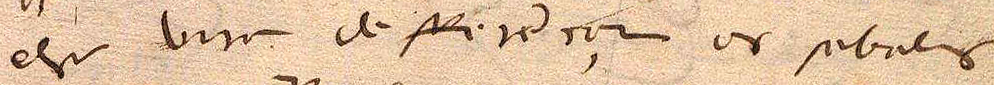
lhe vira deferēçar os sabados
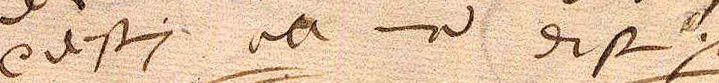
e deste all nā dise ./.
